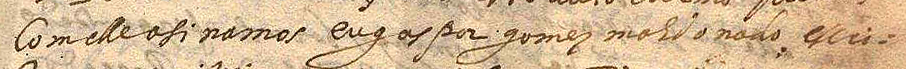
Com elle asinamos eu gaspar gomez maldonado escri
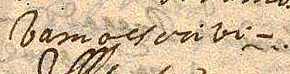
vam o escrivi -.
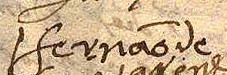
fernão de
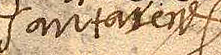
santarem
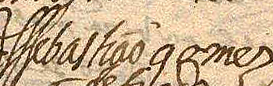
sebastião gomez
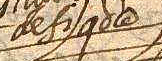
de figdo
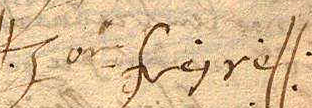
Jor frejre //.
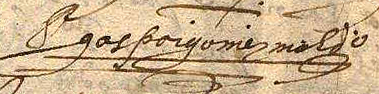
gaspar gomez maldo
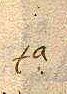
ta
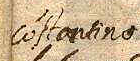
cōstantino
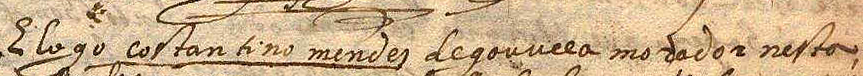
E logo costantino mendes de gouuea morador nesta
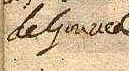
de Gouuea
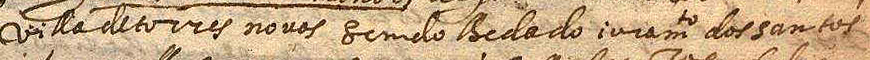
villa de torres nouas semdo lhe dado iuramto dos santos
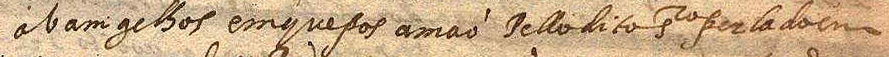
avamgelhos em que pos a maõ pello dito sro perlado em
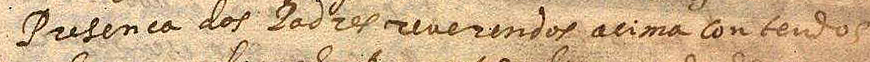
Presença dos Padres reuerendos acima conteudos
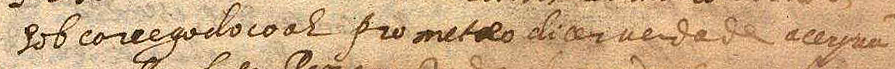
sob carrego do coal prometeo dizer uerdade acerqua
